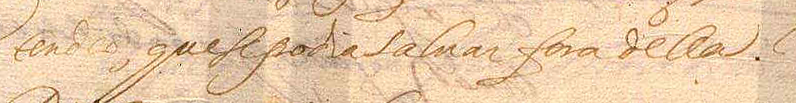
tendeo, que se podia saluar fora della?
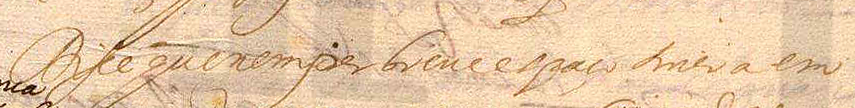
Disse que nem por breue espaço tiuera em
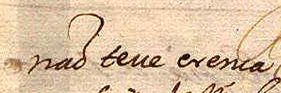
naõ teue crença
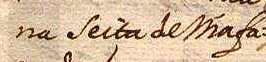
na seita de Mafa
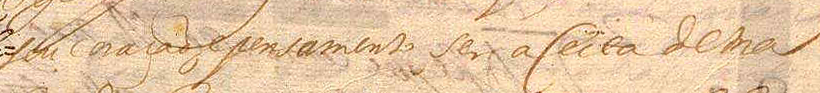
seu coraçaõ e pensamento ser a Ceita de ma
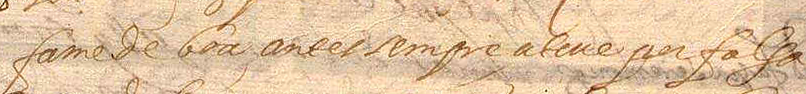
famede boa, antes sempre a teue por falsa,
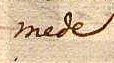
mede
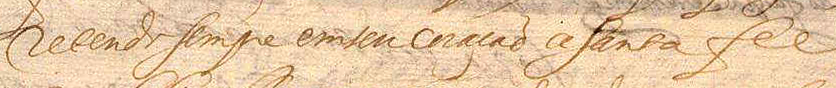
retendo sempre em seu coraçaõ a santa fee
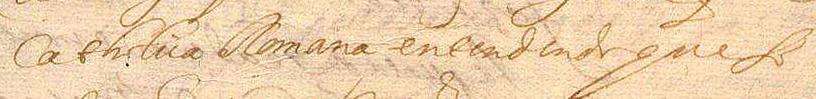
Catholica Romana entendendo que só
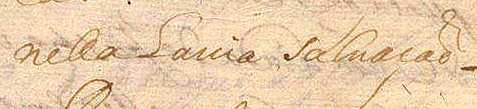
nella hauia saluaçaõ
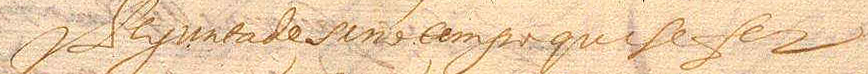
item Perguntado se no tempo que se fez
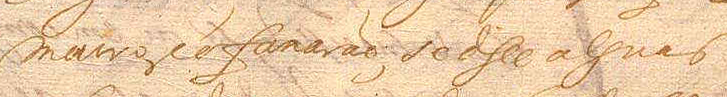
mouro, e o fanaraõ, se disse alguās
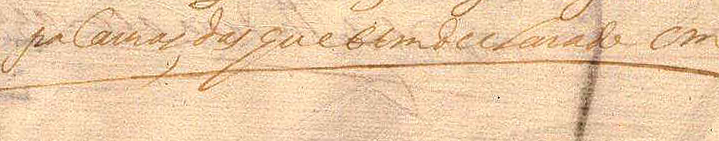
palauras das que tem declarado em
